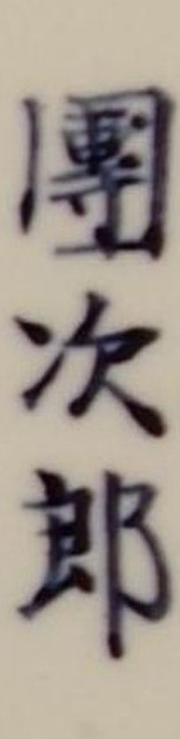團次郎
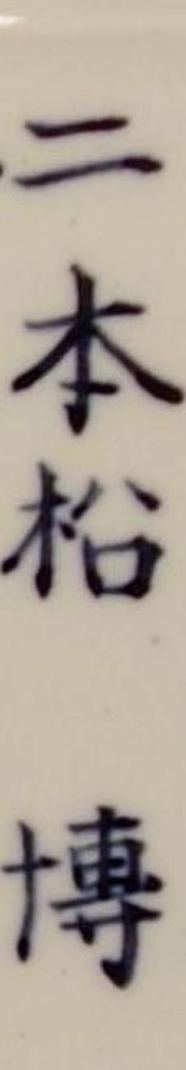二本松博
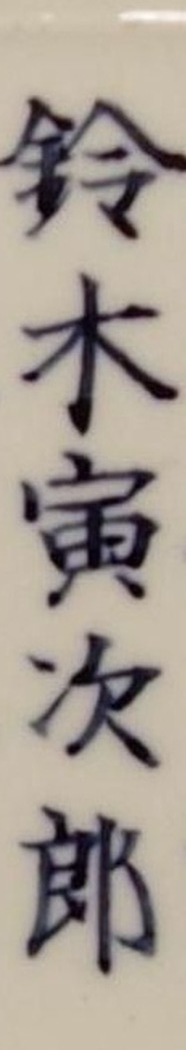鈴木寅次郎
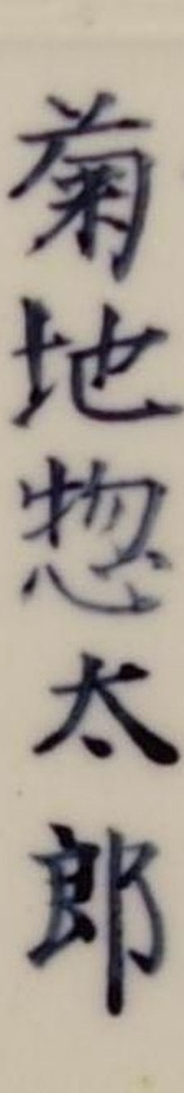菊地惣太郎
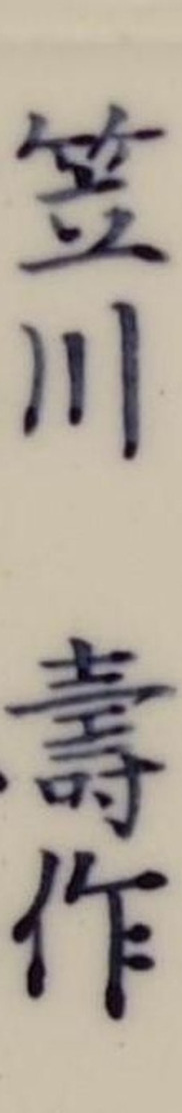笠川壽作
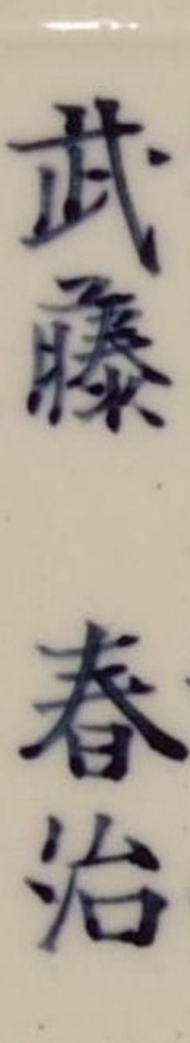武藤春治
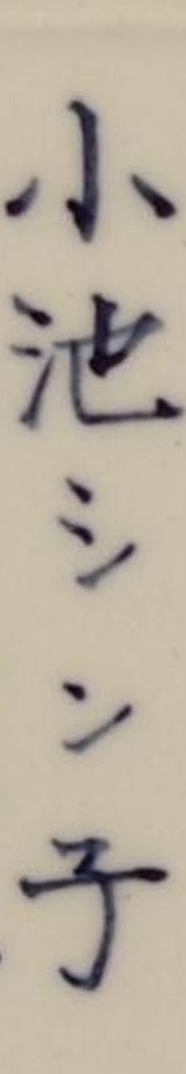小池シン子
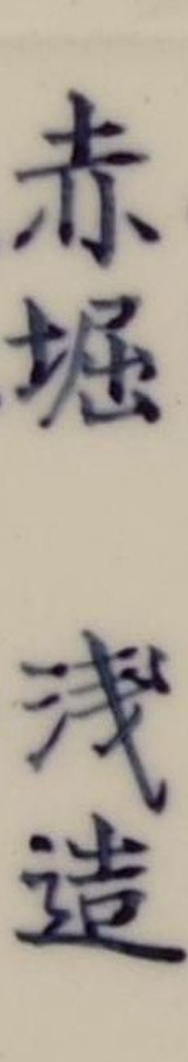赤堀浅造
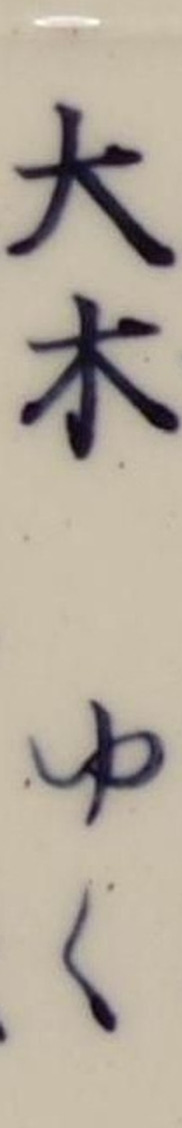大木ゆく
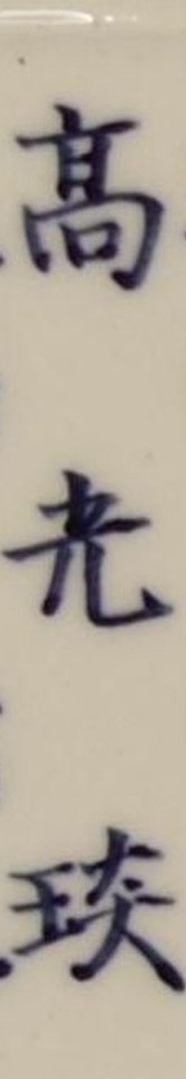高光英
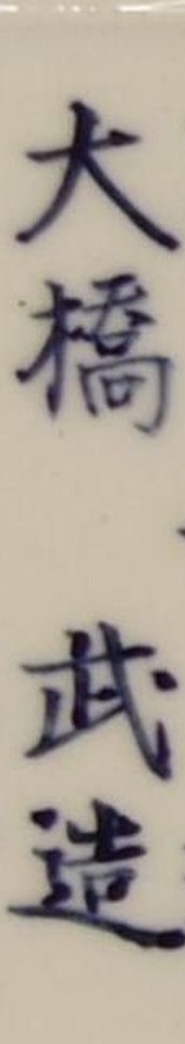大橋武造
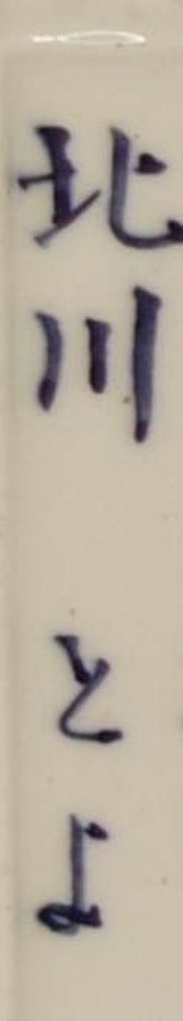北川とよ

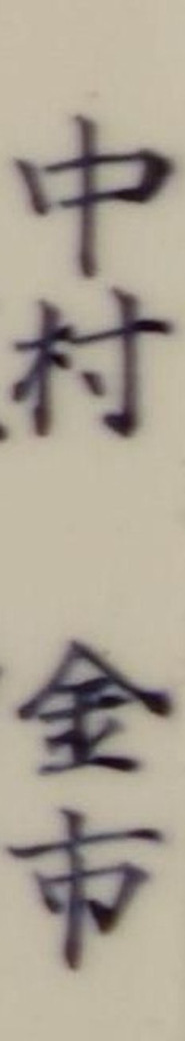中村金市
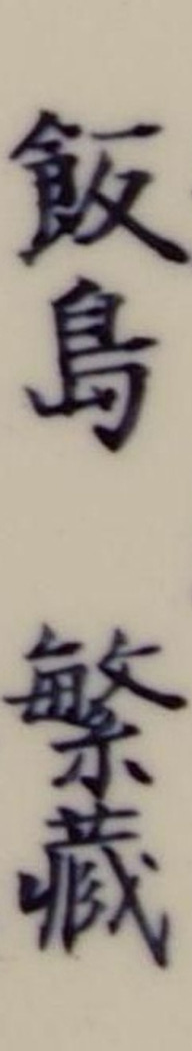飯島繁蔵
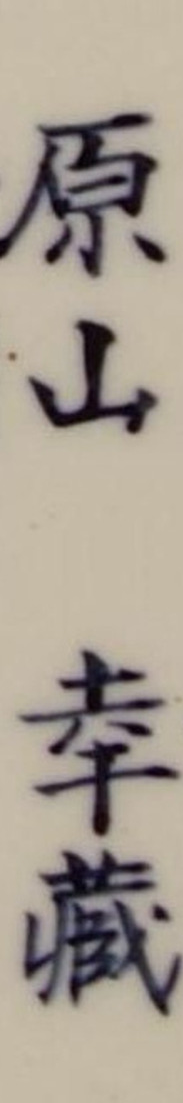原山幸蔵
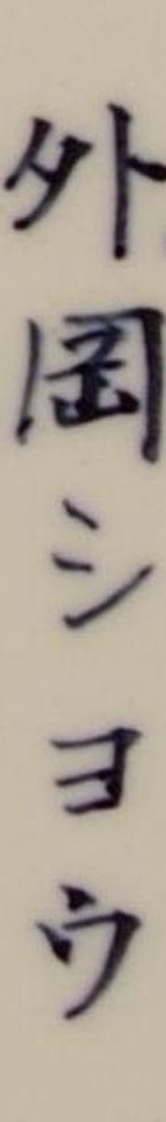外岡シヨウ
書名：M~S
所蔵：高野山金剛峯寺
